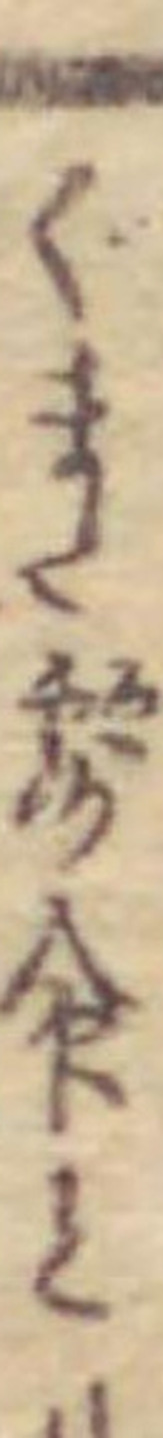ぐまた露命と
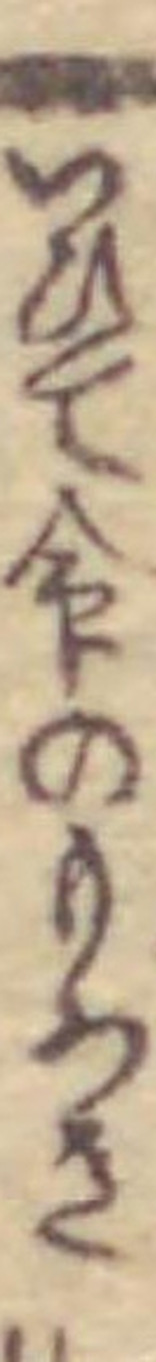いひて命のもろき
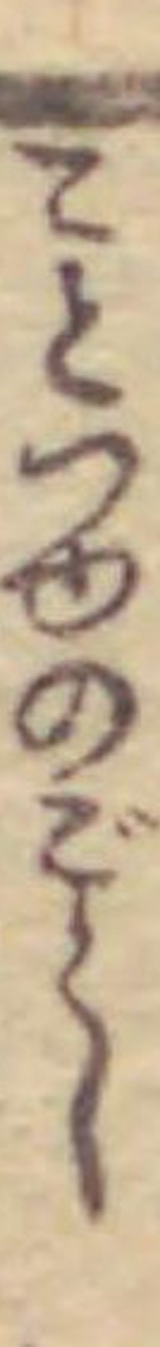ことつゆのごとし
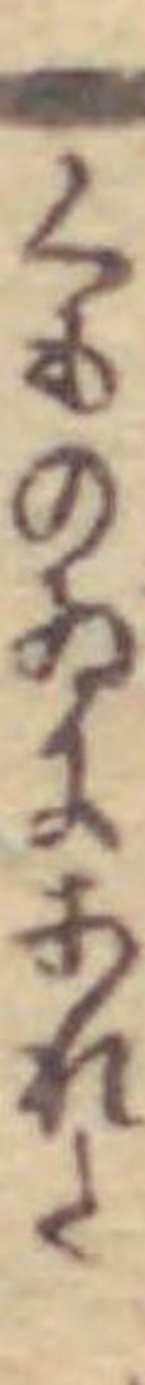くものゐにあれた
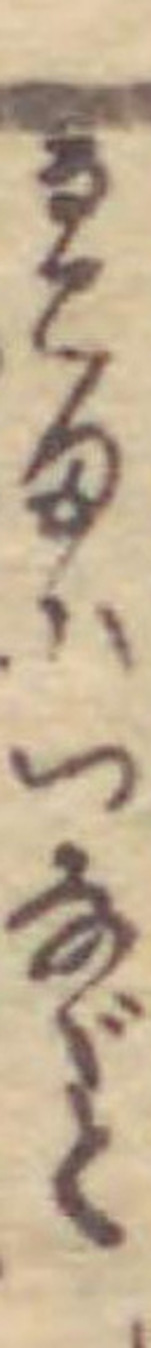るこまはつなぐと
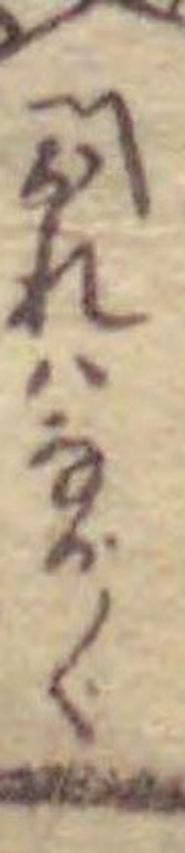〽おれはなか〳〵
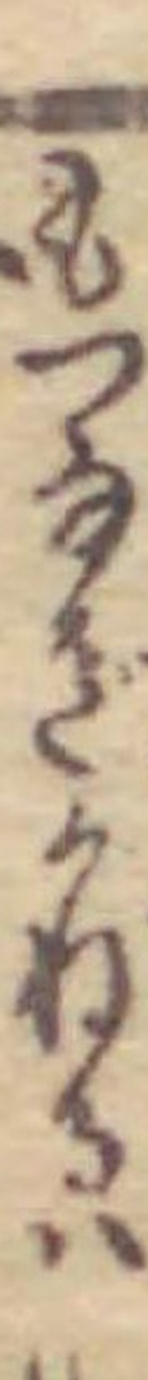もつなぎかねるは
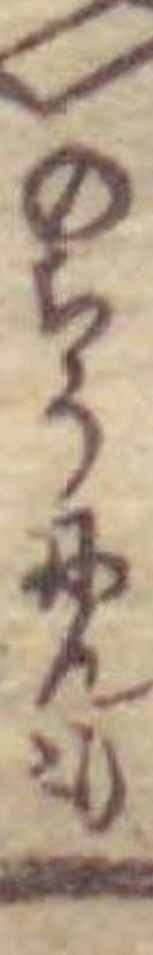のちうにんも
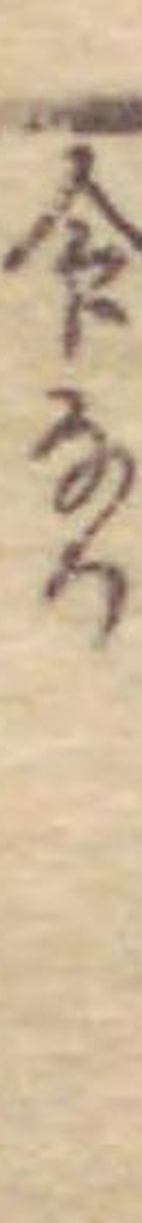命なり
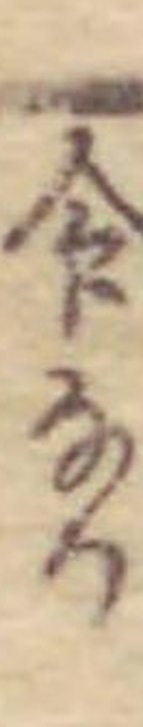命なり
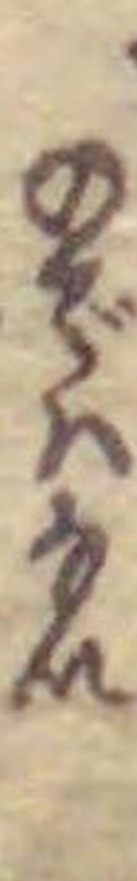のではない
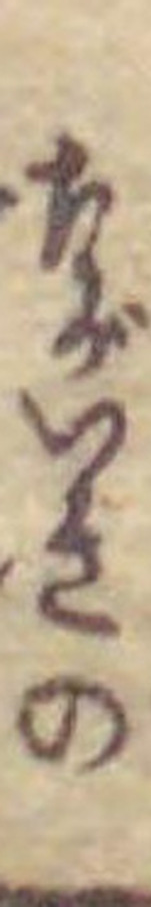ながいきの
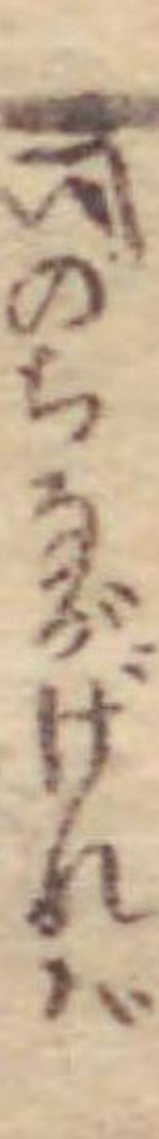〽いのちながげれば
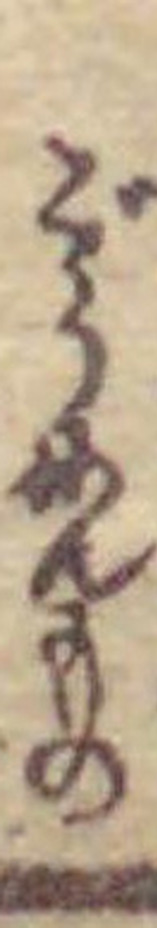ごうめんもの
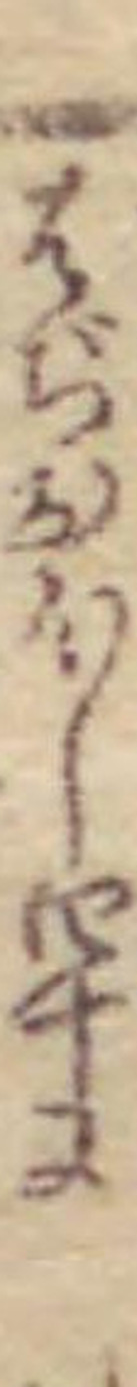はぢおほし四十に
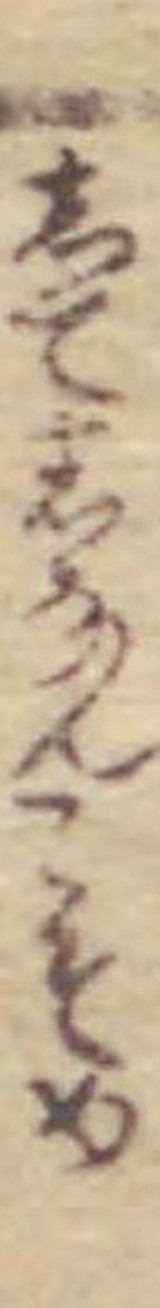してしなんこそめ
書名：御誂染長寿小紋 : 3巻
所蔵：国立国会図書館 National Diet Library, JAPAN
